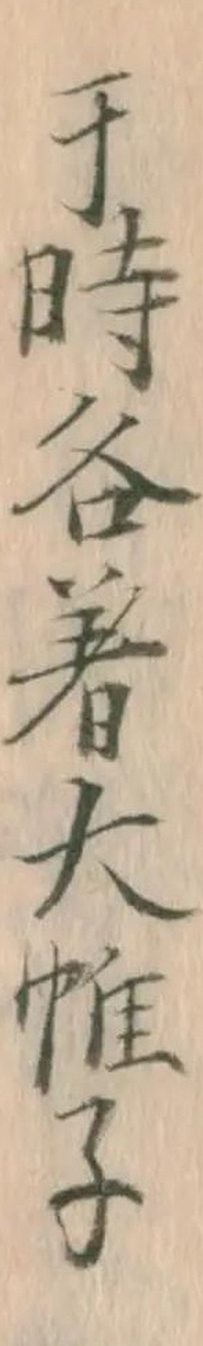于時各著大帷子
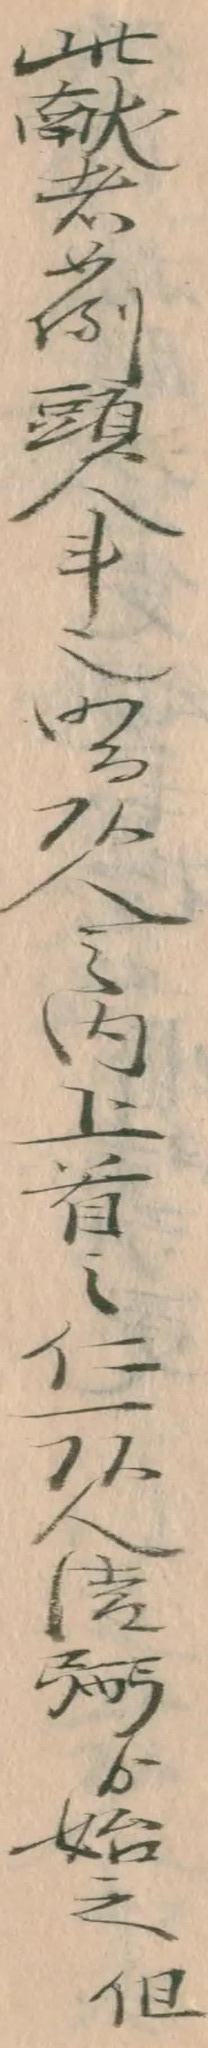此献者如例頭人斗也仍而頭人之内上首之仁一頭人清弼ゟ始之但
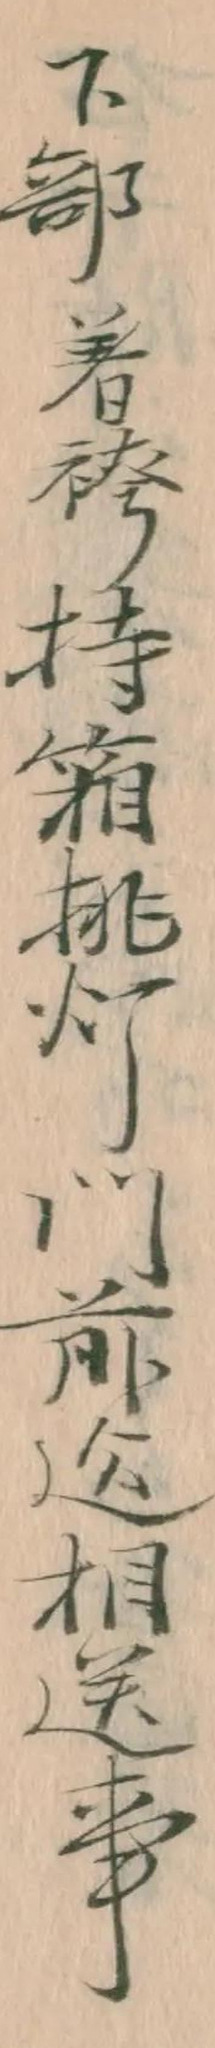下部着袴持箱挑灯門前迄相送事
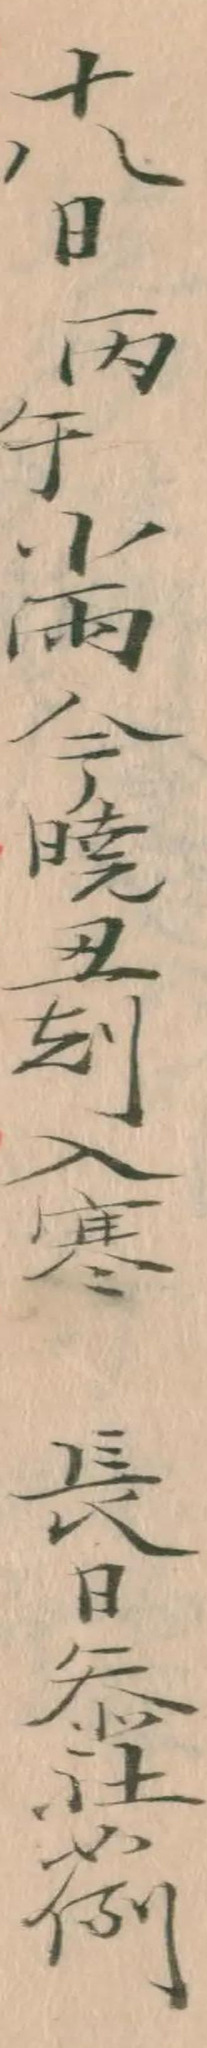十八日丙午小雨今暁丑刻入寒長日泰社如例
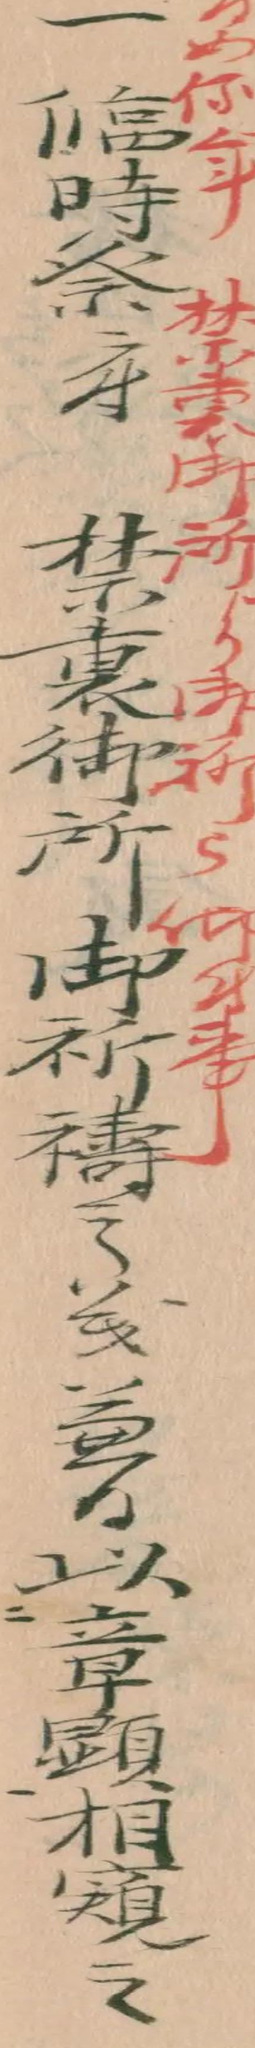一臨時祭ニ付禁裏御所御祈祷之義兼日以章顕相窺之
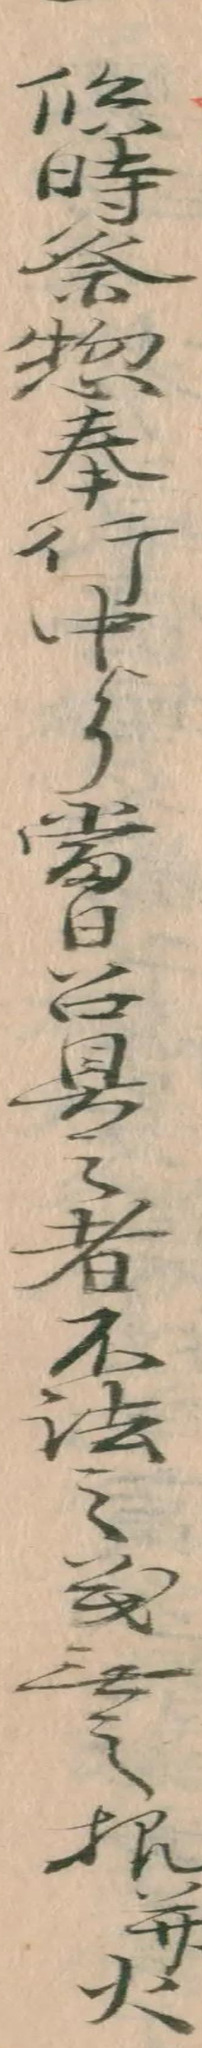一臨時祭惣奉行中より當日召具之者不法之義無之様并火
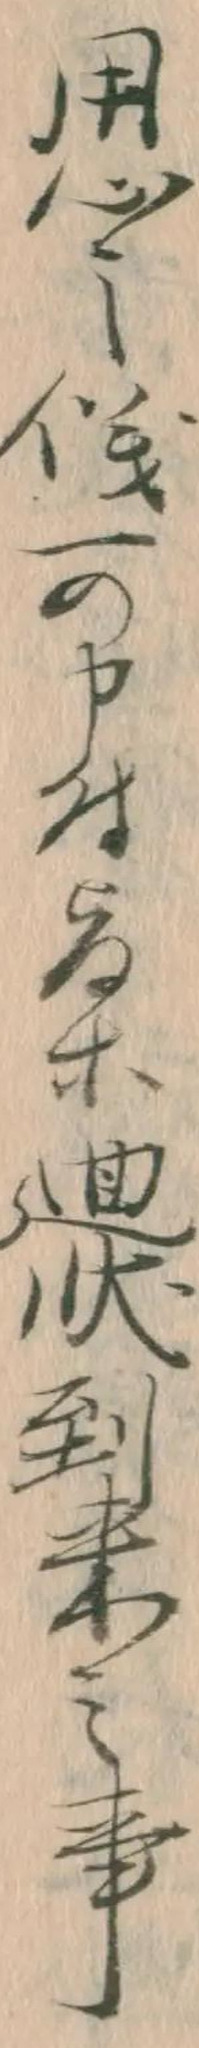用心之儀可申付旨等廻状到来之事
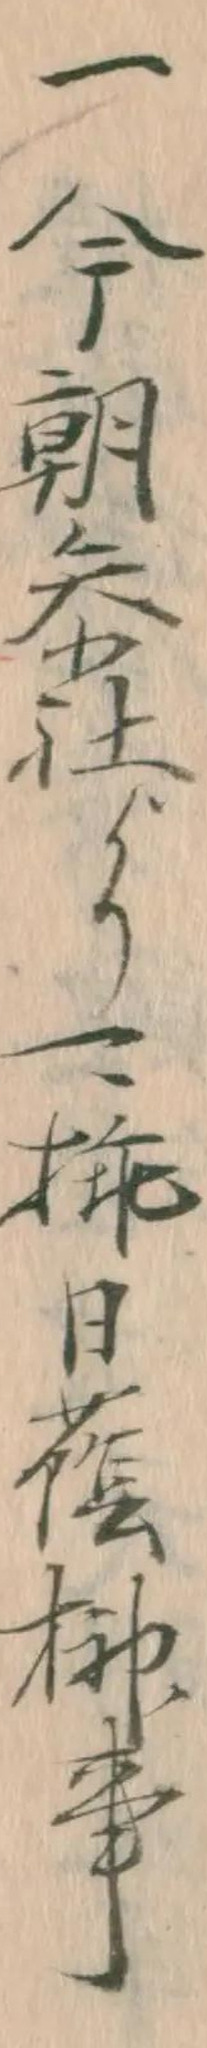一今朝参社より可挿日蔭榊事
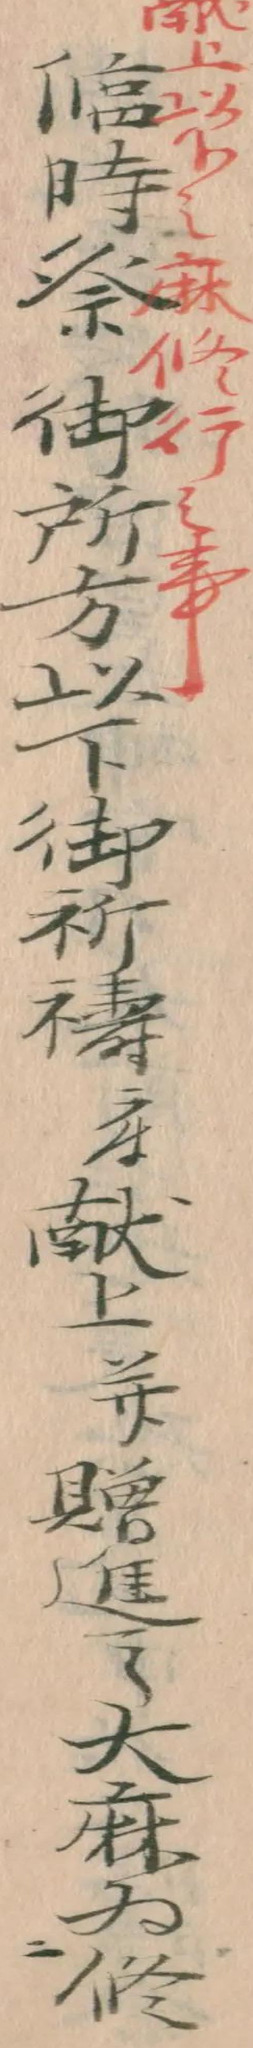一臨時祭御所方以下御祈祷ニ付献上并贈進之大麻為修
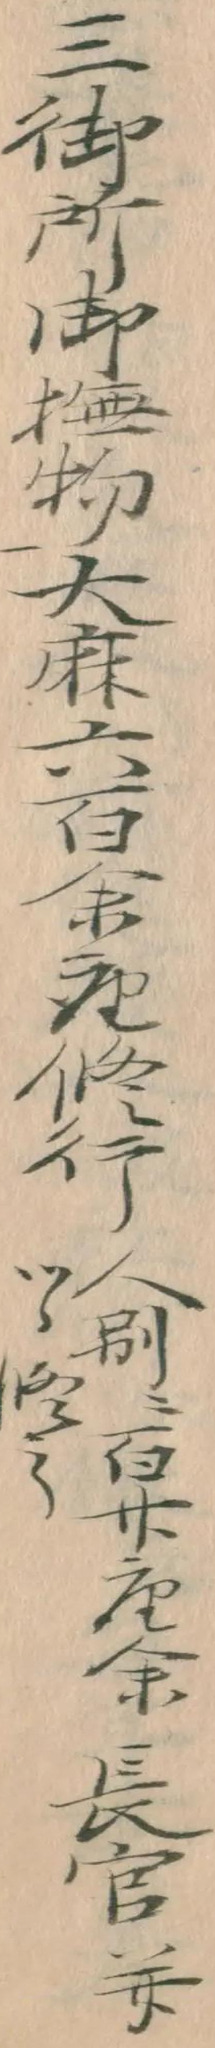三御所御撫物大麻六百余座修行人別ニ百廿唐余長官并ツ修之
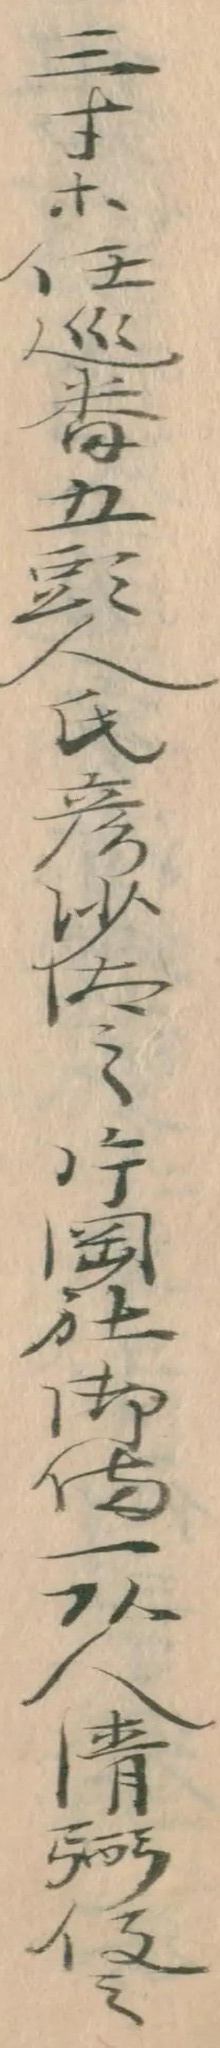三寸等任巡番五頭人氏彦沙汰之片岡社御備一頭人清弼役之

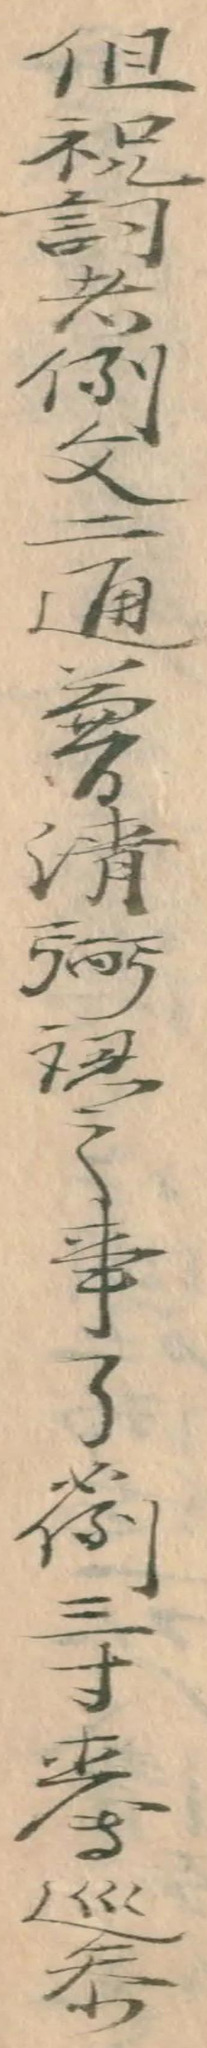但祝詞者例文ニ通兼日清弼認之事了如例三寸直會巡参
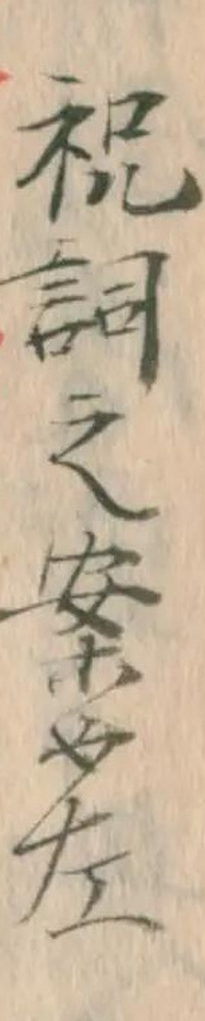祝詞之案如左
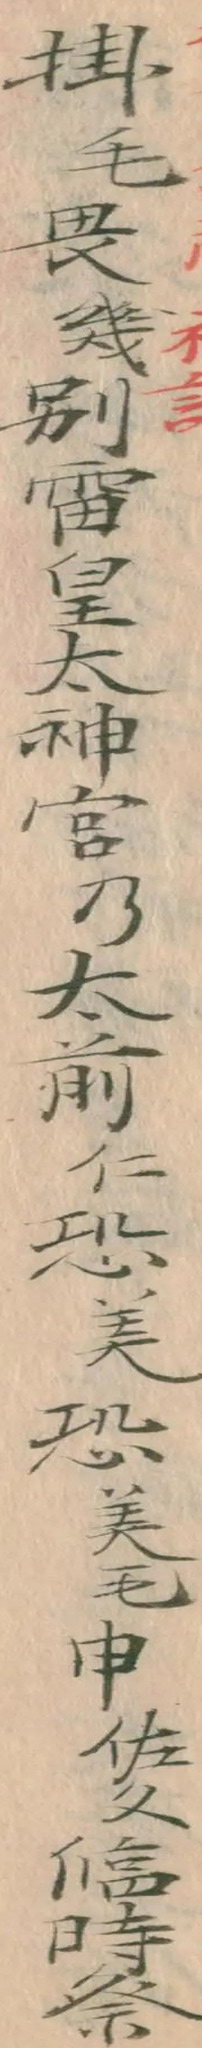掛毛畏幾別雷皇太神宮乃太前仁恐美恐美毛申佐久臨時祭
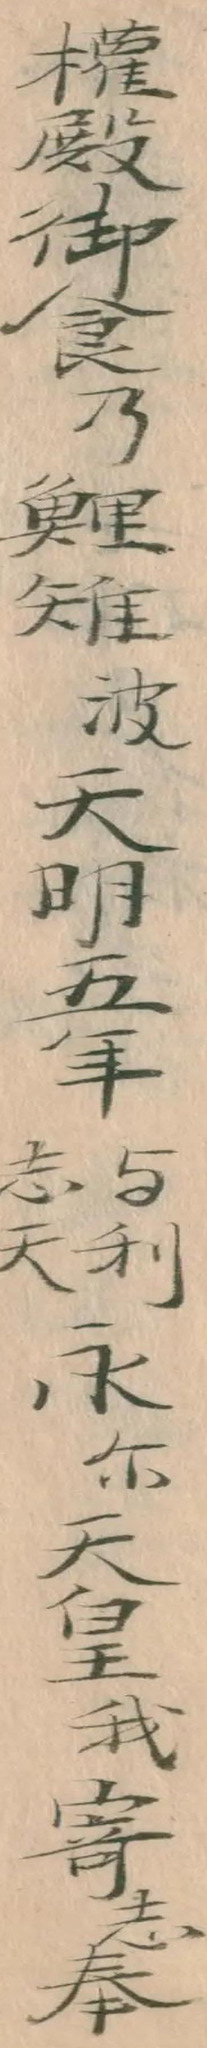權殿御食乃鯉雉波天明五年与利志天永尓天皇我寄志奉
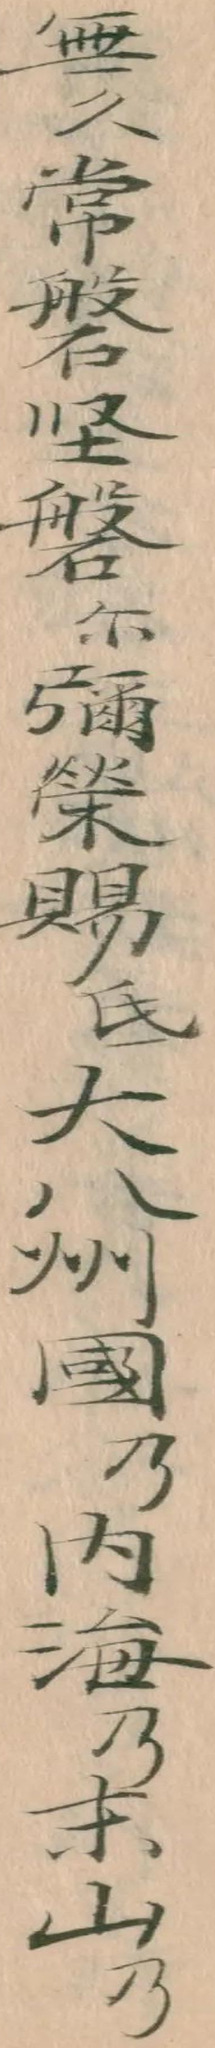無久常磐堅盤尓彌榮賜氐大八州國乃内海乃末山乃
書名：賀茂社記録. 第74冊
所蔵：国立国会図書館 National Diet Library, JAPAN
